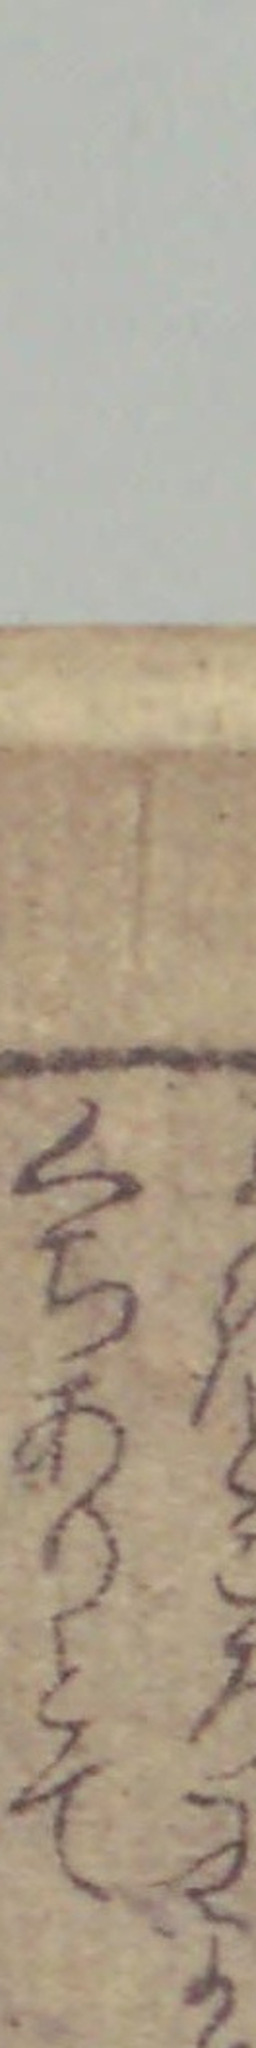くちありとて
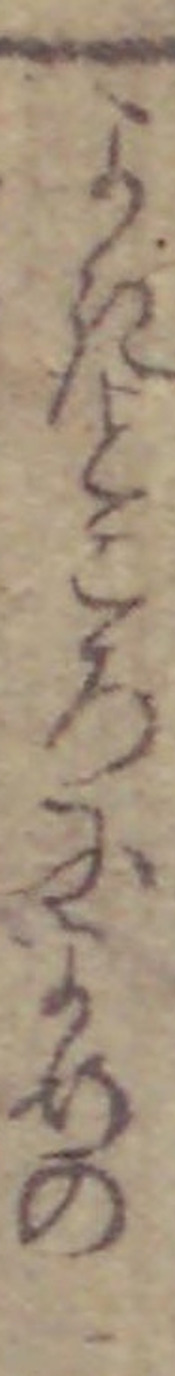よきところによめの
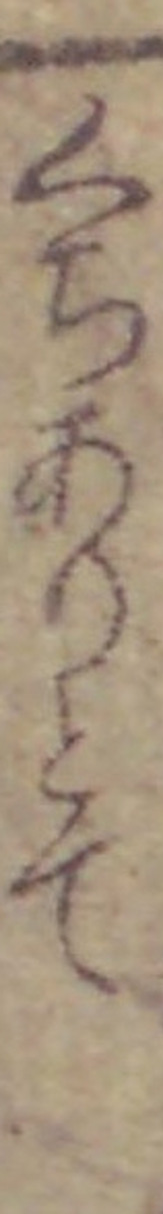くちありとて
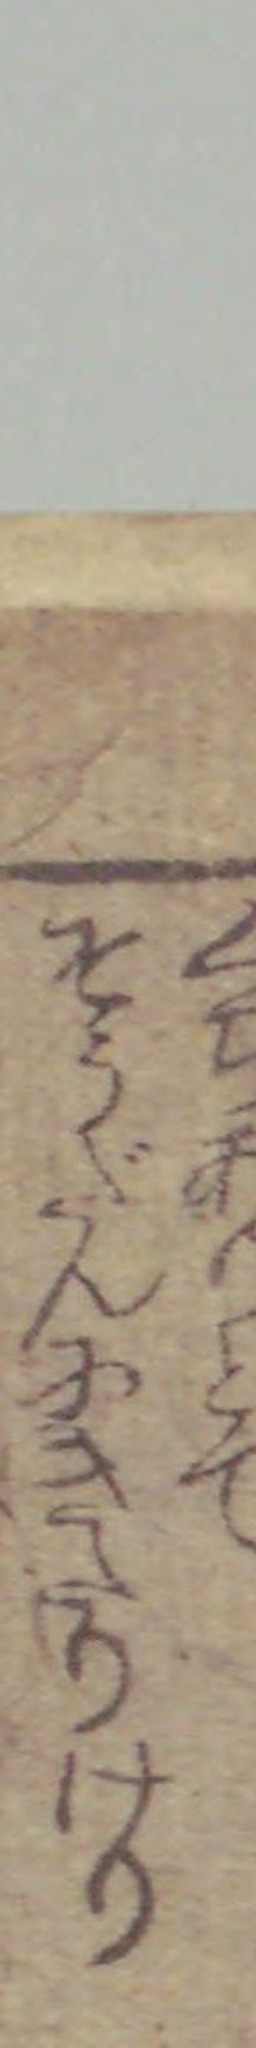そうだんにきたりけり
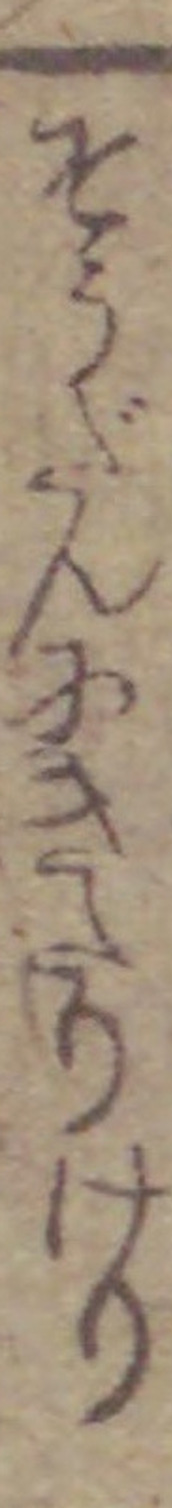そうだんにきたりけり
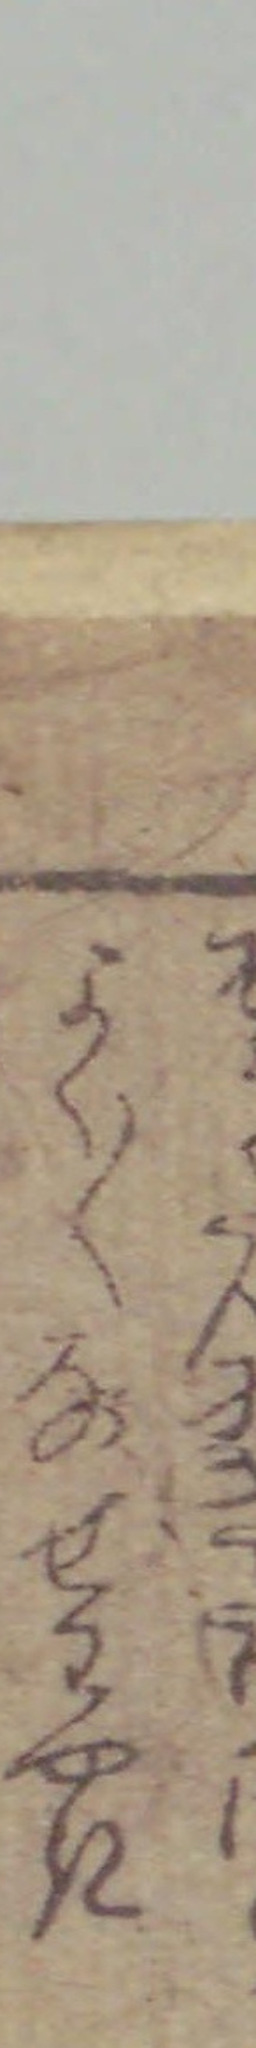よく〳〵なせわやき
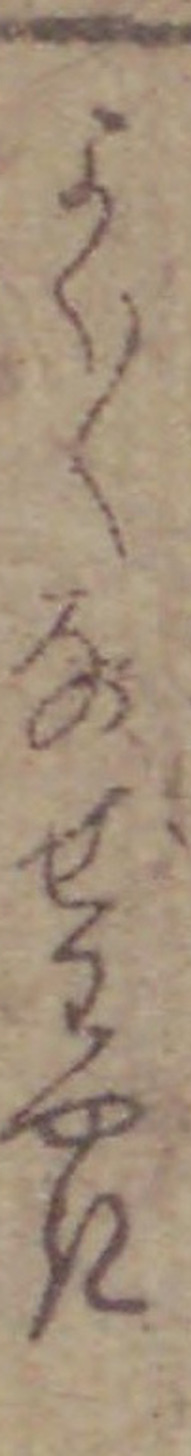よく〳〵なせわやき
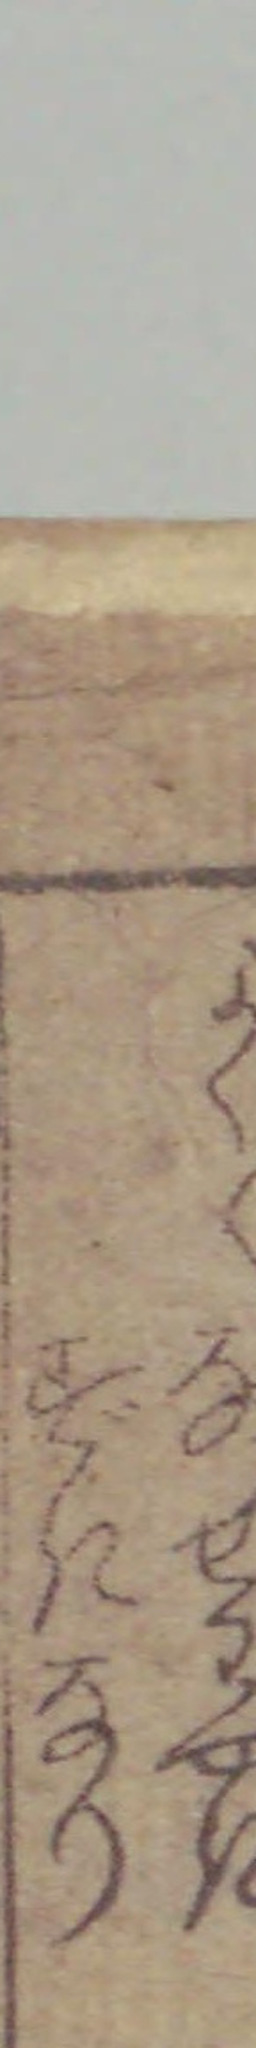ずきなり

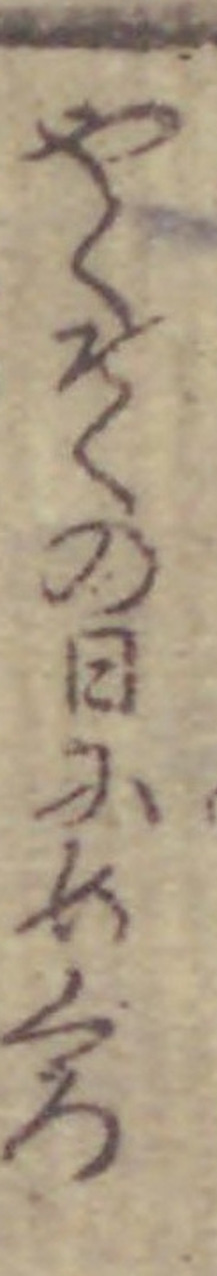やくそくの日にめくろ
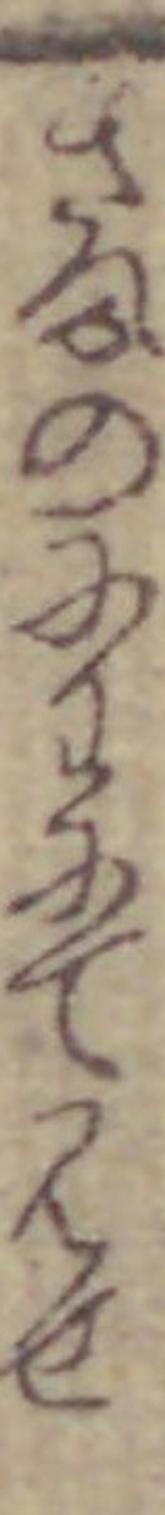さまのにわにてみせ
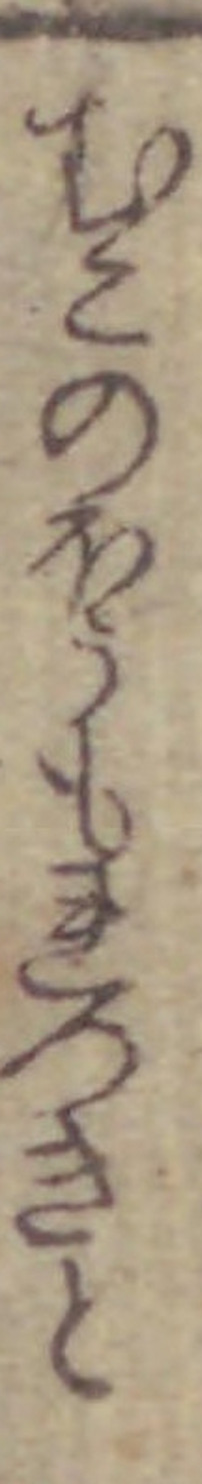むこのほうもれつきと
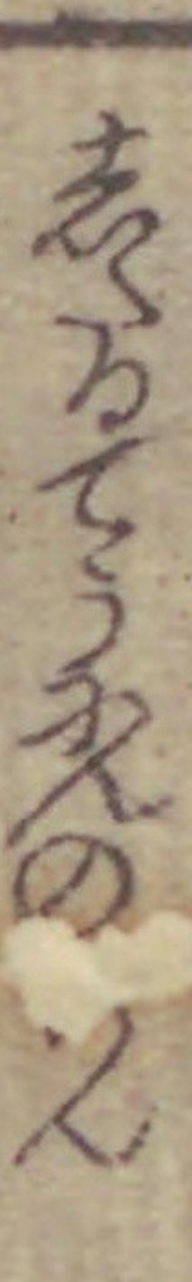したるてうにんのん
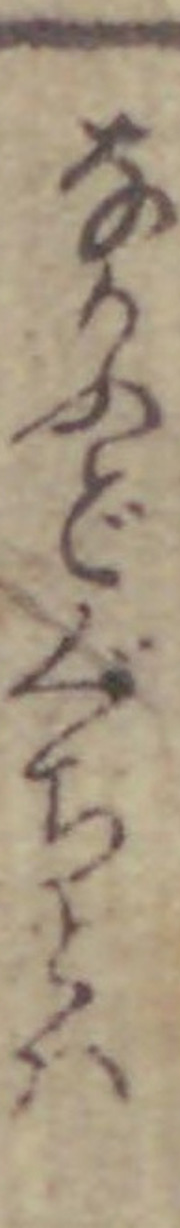なかふどくちとは
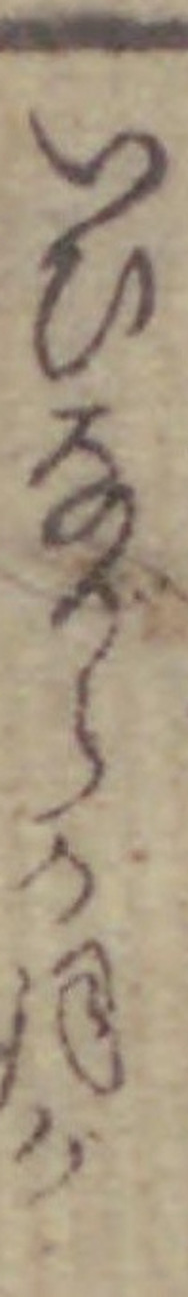いひながらかほが
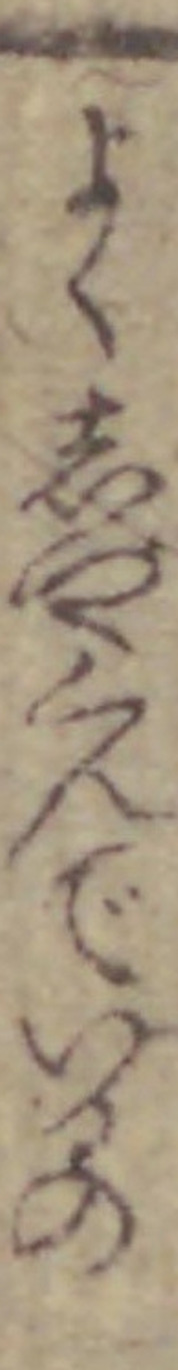よくしやくんでいるの
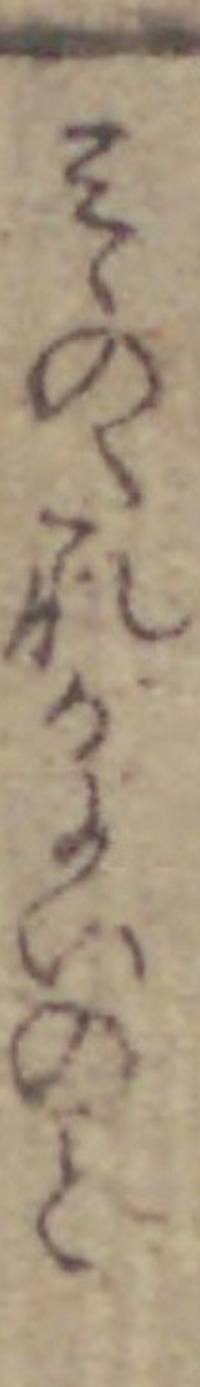みゝのたれがよいのと
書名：狆の嫁入 2巻
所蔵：国立国会図書館 National Diet Library, JAPAN
